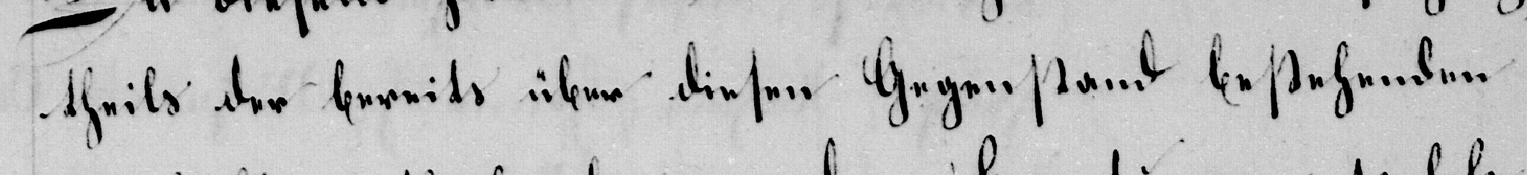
theils der bereits über diesen Gegenstand bestehenden
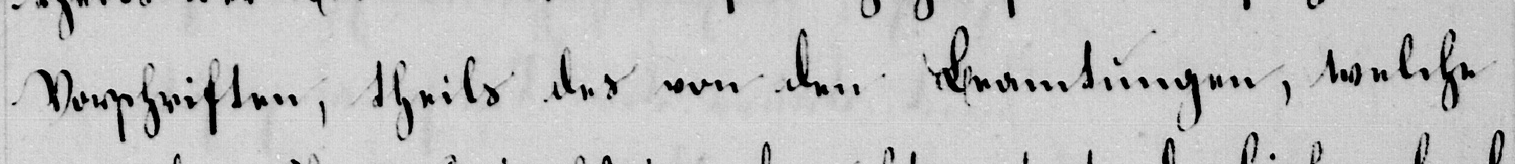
Vorschriften, theils des von den Beamtungen, welche
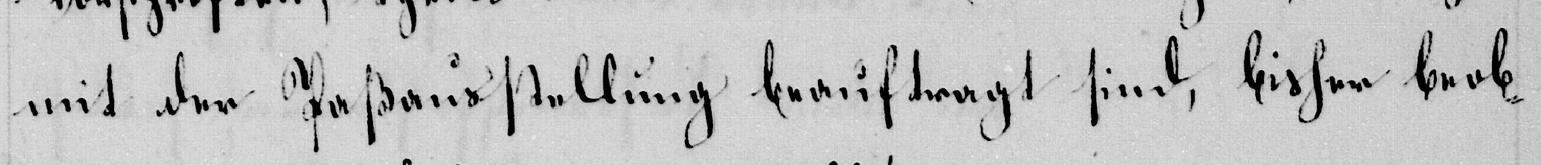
mit der Paßausstellung beauftragt sind, bisher beob¬
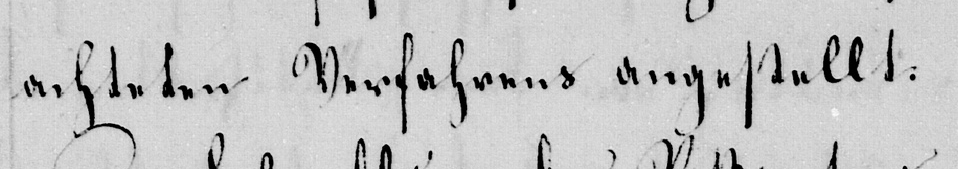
achteten Verfahrens angestellt.
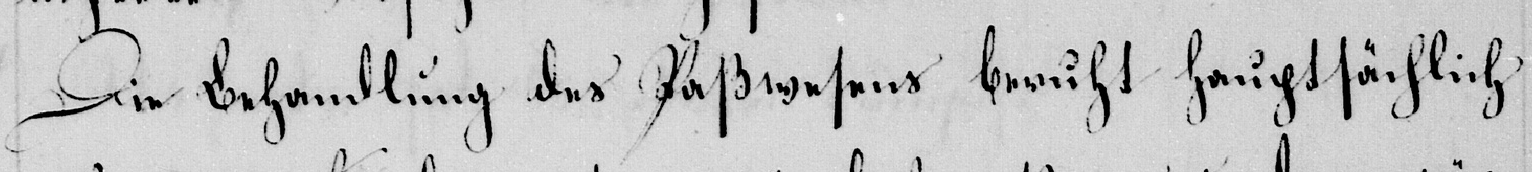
Die Behandlung des Paßwesens beruht hauptsächlich
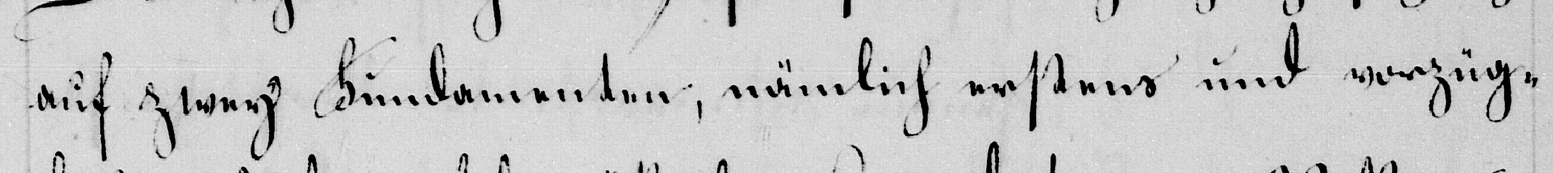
auf zwey Fundamenten, nämlich erstens und vorzüg¬
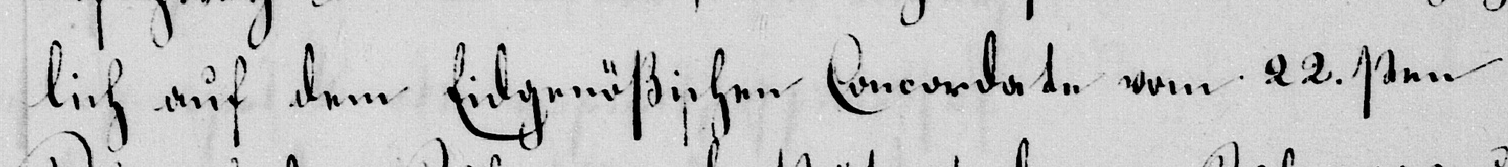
lich auf dem Eidgenößischen Concordate vom 22.sten
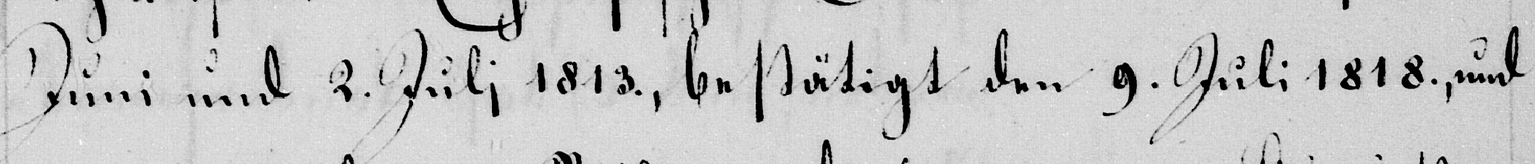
Juni und 2. Juli 1813., bestätigt den 9. Juli 1818., und
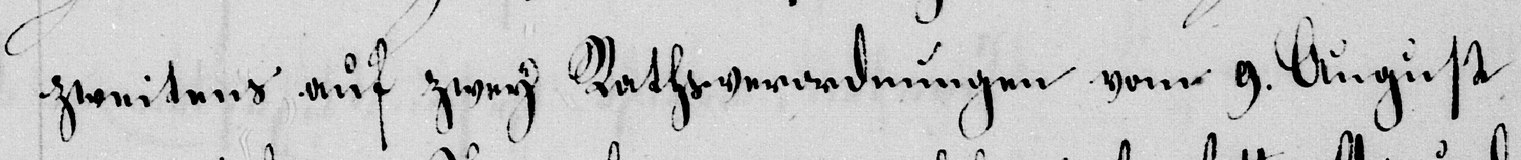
zweitens auf zwey Rathsverordnungen vom 9. August
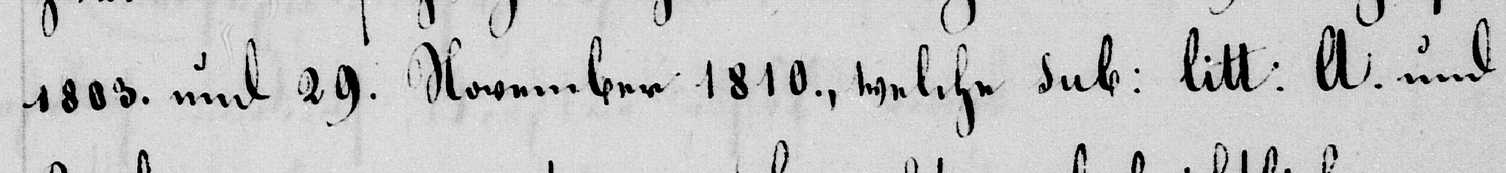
1803. und 29. November 1810., welche sub: litt. A. und
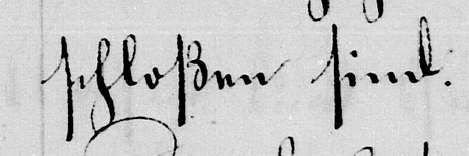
schloßen sind.
